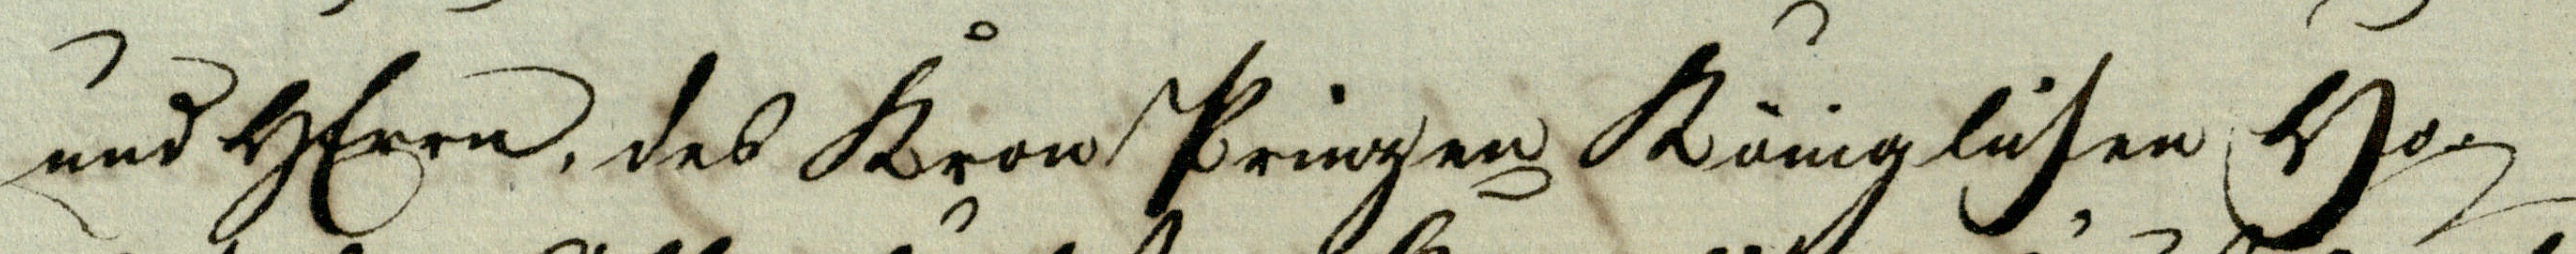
und Herrn, des Herrn Prinzen königlichen Ho¬
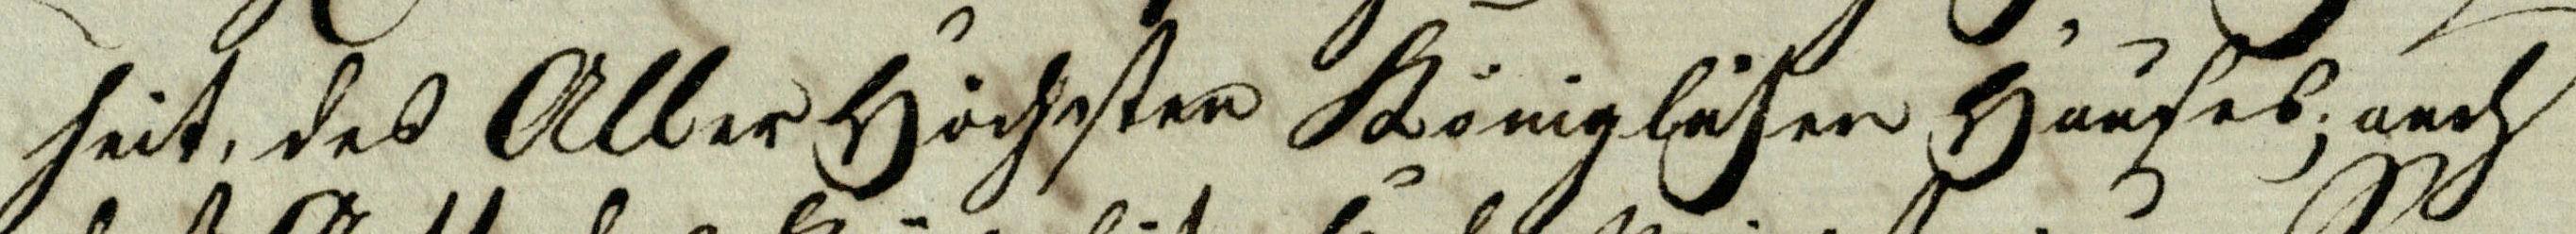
heit, des Allerhöchten königlichen Hauses; auch
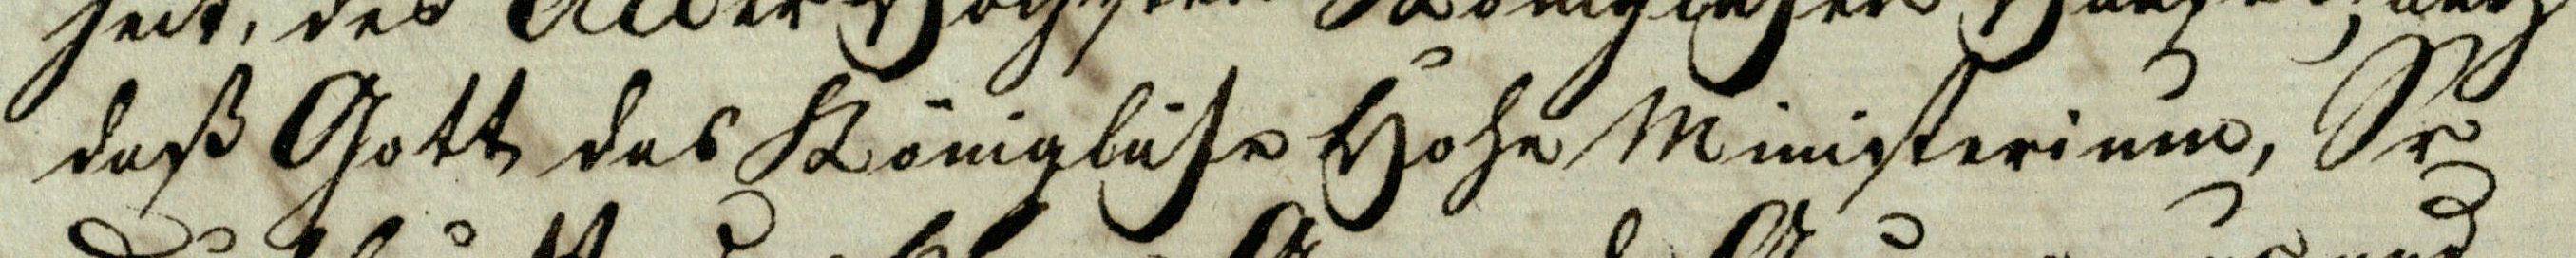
daß rtl das Königliche hohe Ministerium Sr
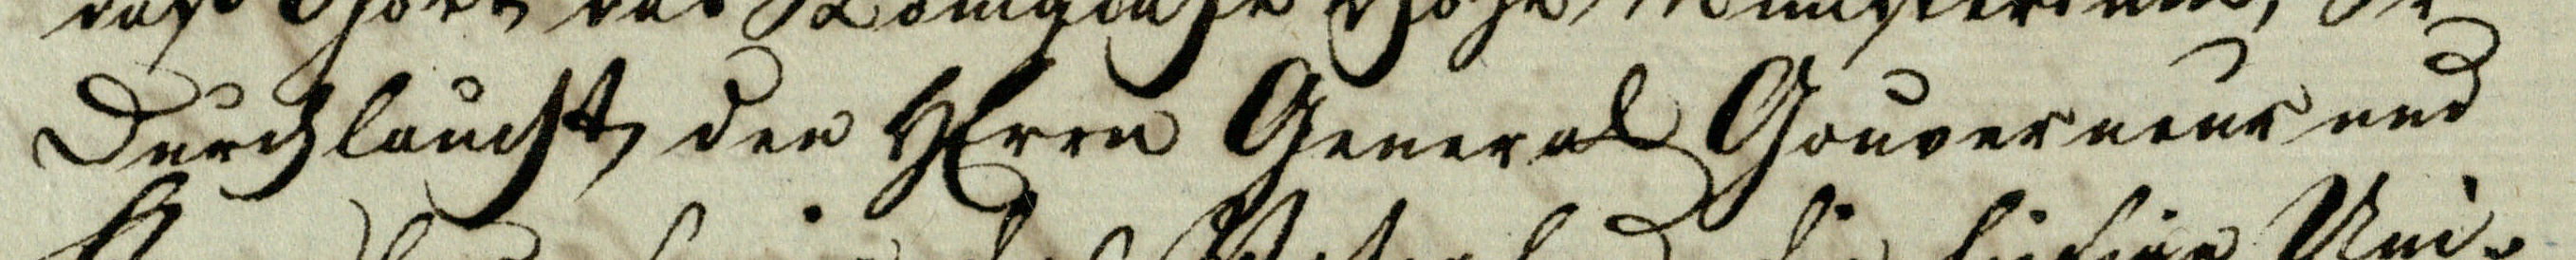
Durchlaucht den Herrn General Gouverneur und
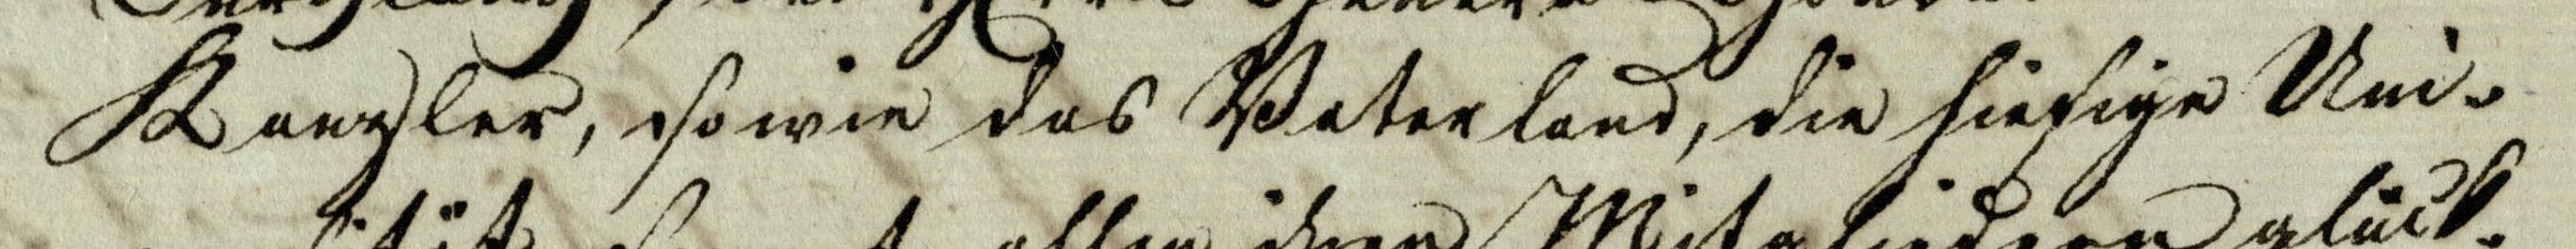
Kanzler sowie das Vaterland, die hiesige Uni¬
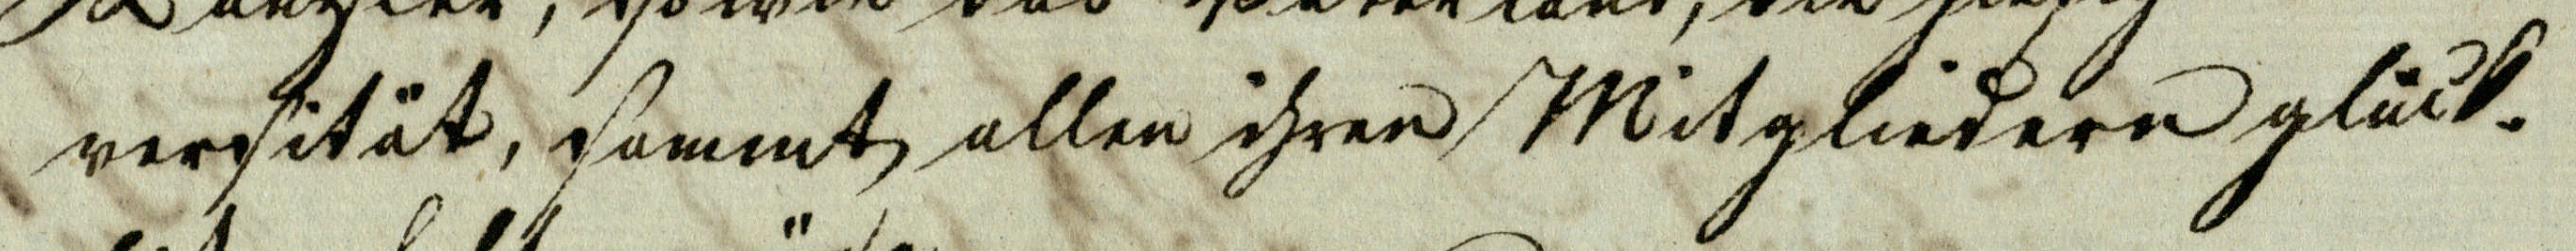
versität, sammt allen ihren Mitgliedern glück¬
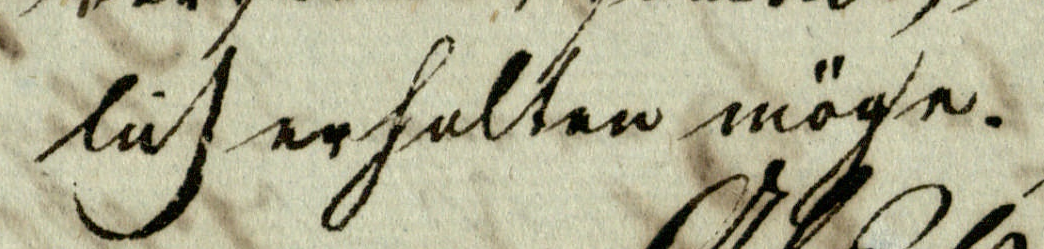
lich erhalten möge.
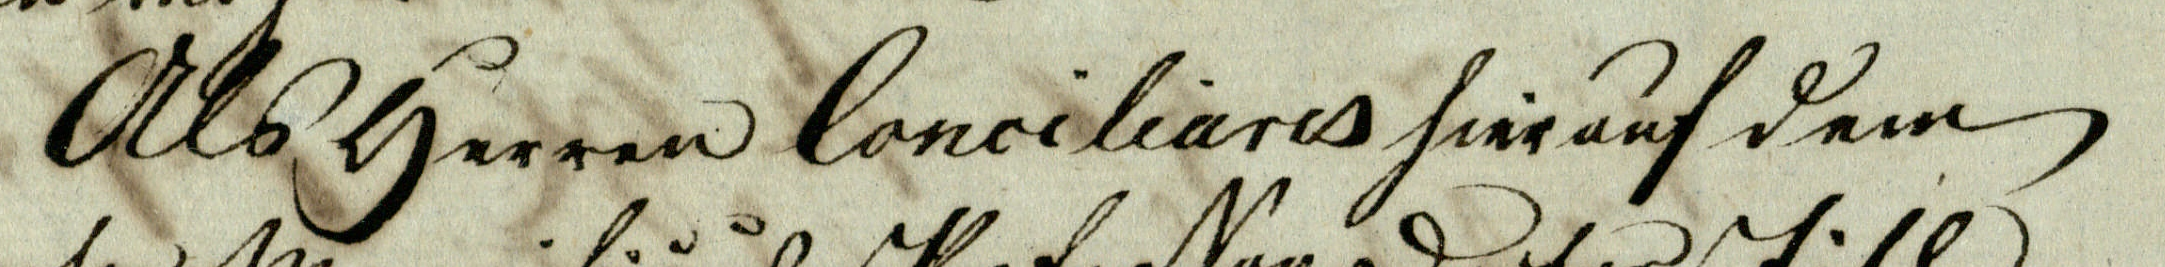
Als Herren Conciliares hier auf dem
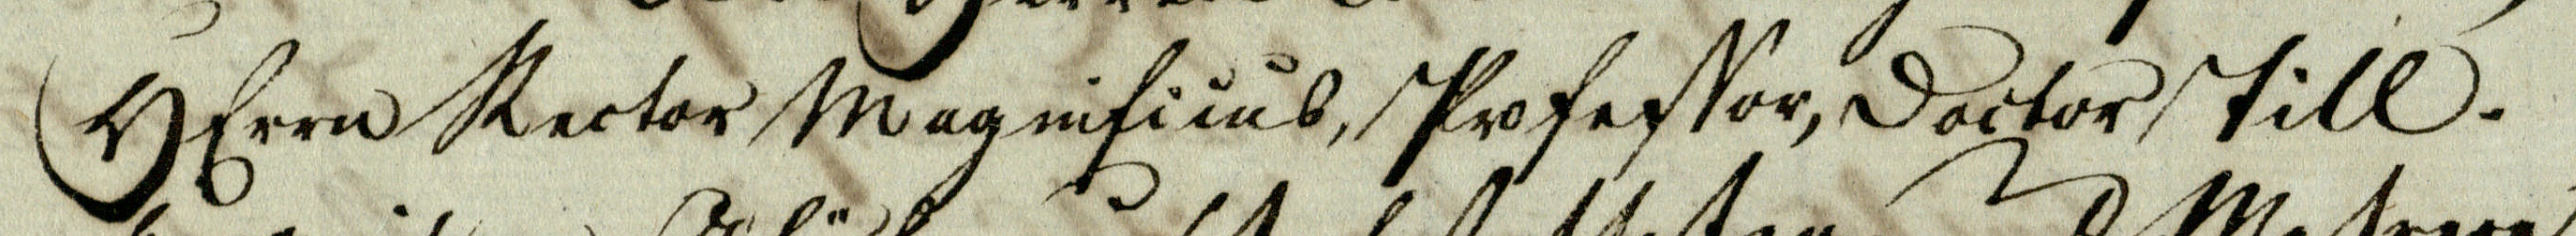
Herrn Rector Magnificus, Professor, Doctor Till¬
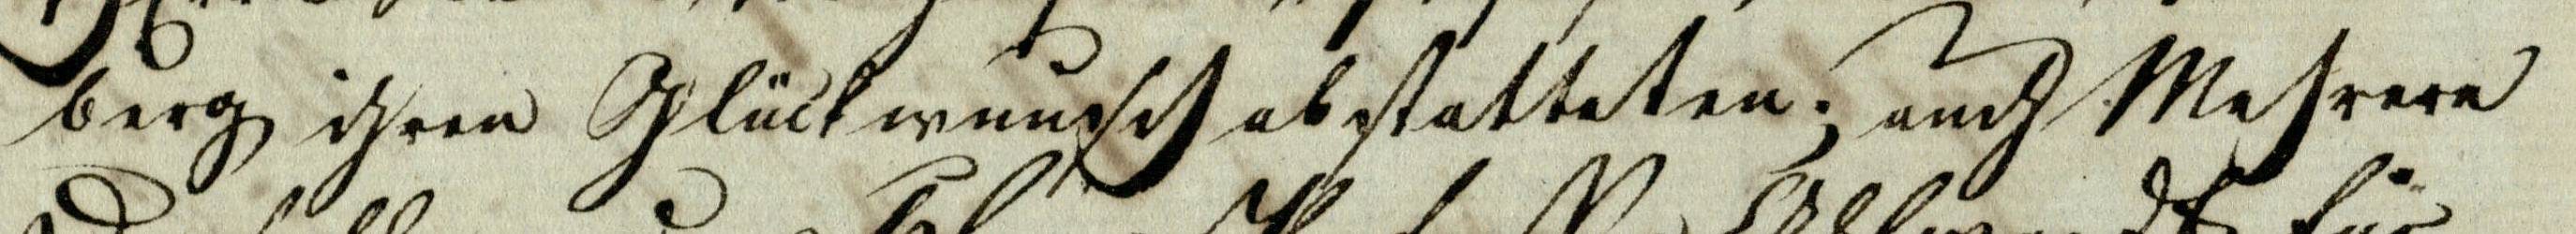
bergihren Glückwunsch abstatteten; auch Mehrere
